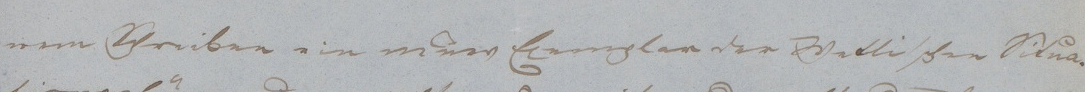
nem Schreiben ein neues Exemplar der Wetli'schen Situa-
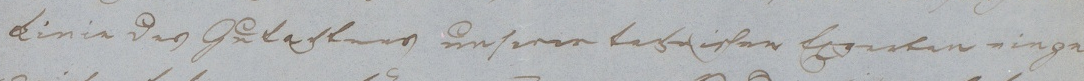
Linie des Gutachtens unserer technischen Experten einge-
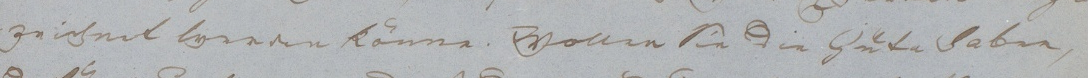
zeichnet werden könne. Wollen Sie die Güte haben,
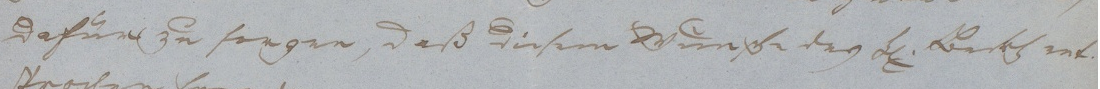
dafür zu sorgen, daß diesem Wunsche des Hrn Beckh ent-
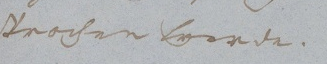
sprochen werde.
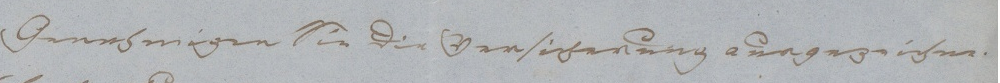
Genehmigen Sie die Versicherung ausgezeichne-
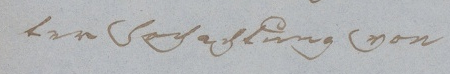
ter Hochachtung von
